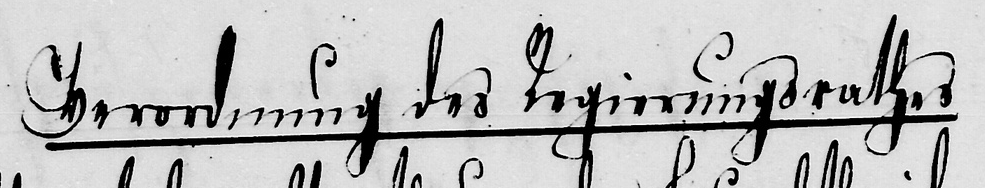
Verordnung des Regierungsrathes
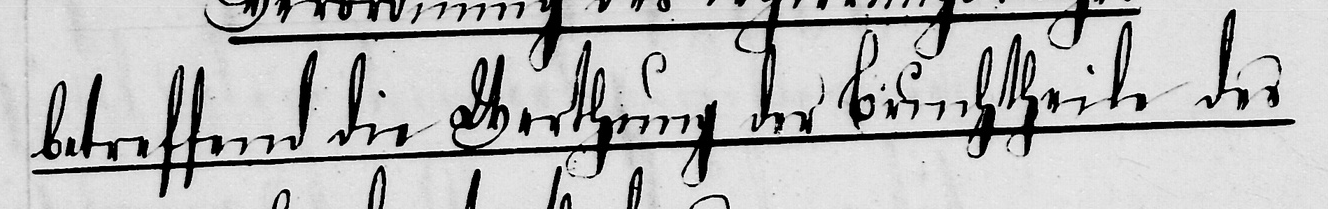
betreffend die Werthung der Bruchtheile des
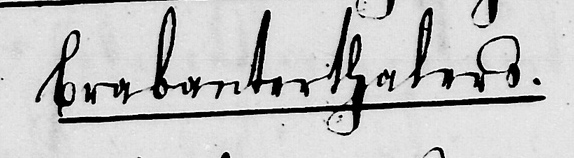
Brabanterthalers.
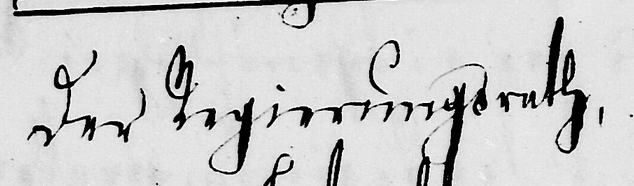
Der Regierungsrath,
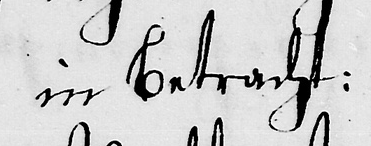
in Betracht:
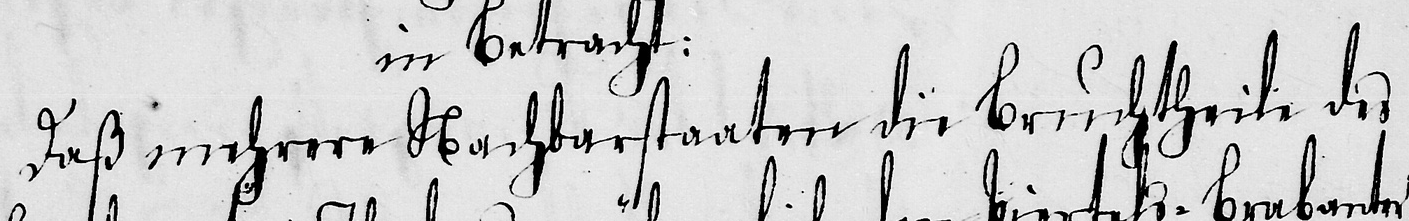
Daß mehrere Nachbarstaaten die Bruchtheile des
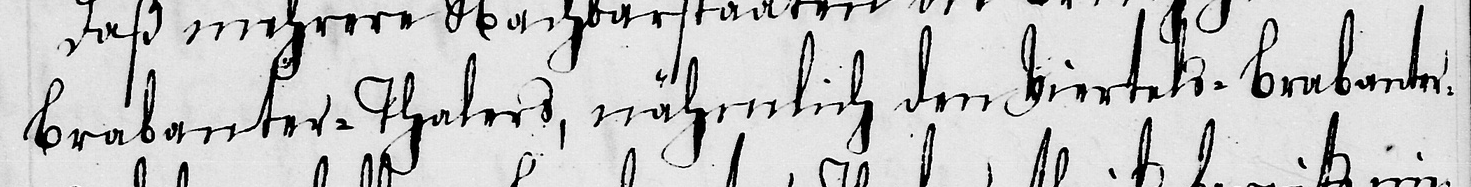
Brabanter-Thalers, nähmlich den Viertels-Brabanter-
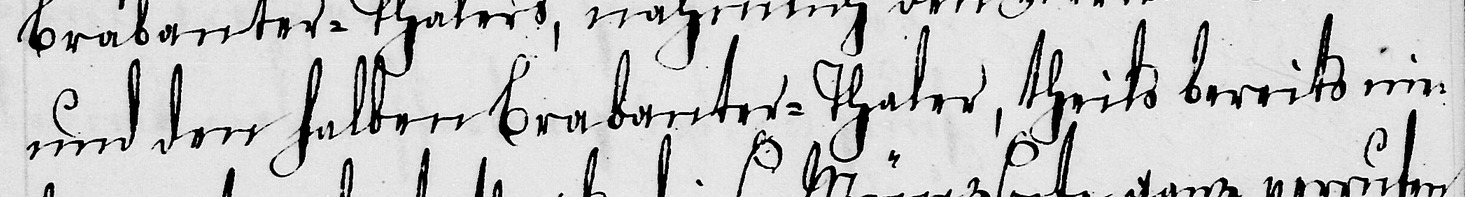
und den halben Brabanter-Thaler, theils bereits nie¬
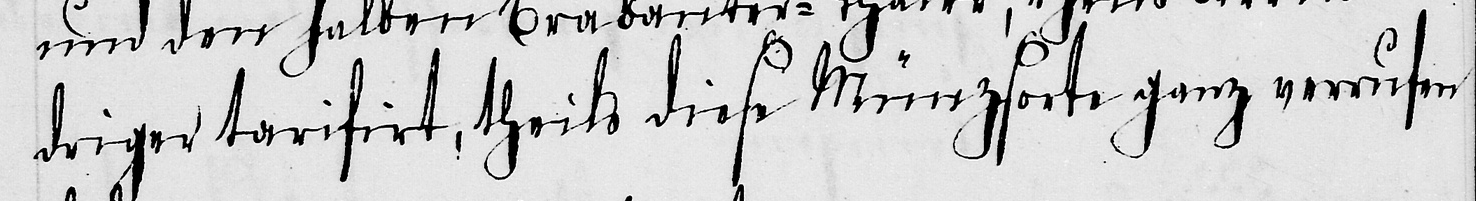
driger tarifirt, theils diese Münzsorte ganz verrufen
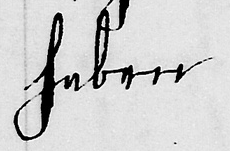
haben
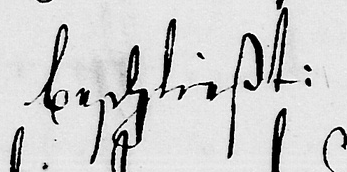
beschließt:
